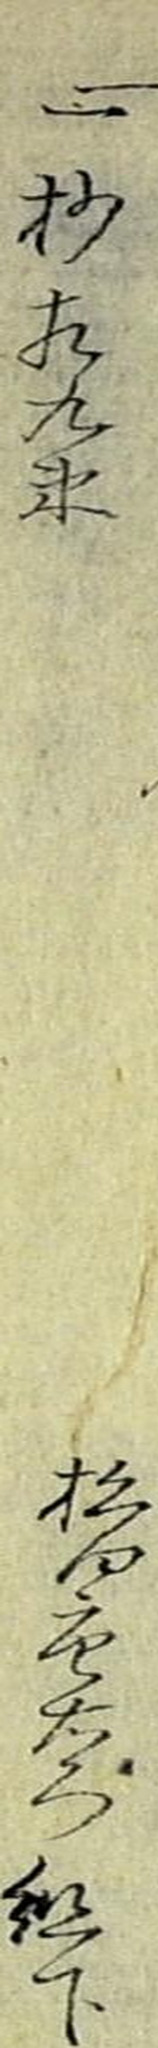一杪拾九束松田市右衛門組下
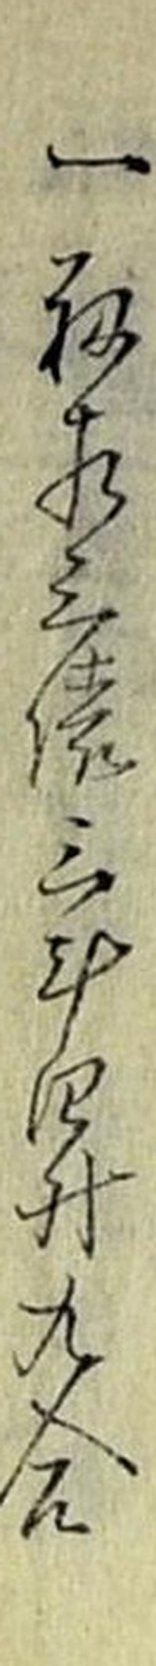一籾四俵四斗四升三合
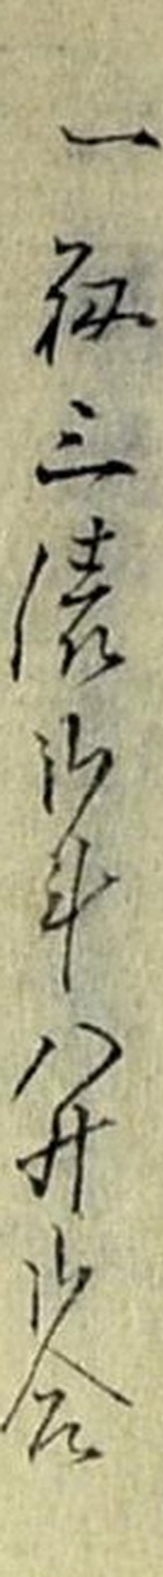一籾四俵四斗四升三合
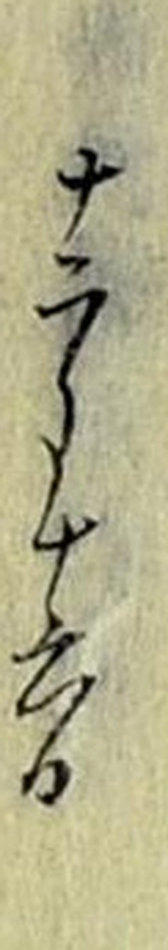十二月十六日
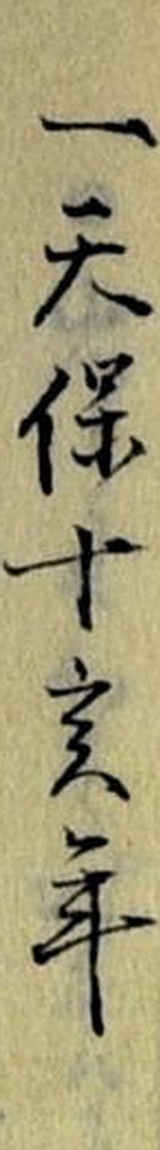一天保十亥年
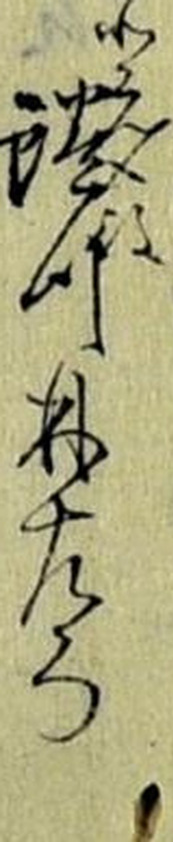蜷川林左衛門
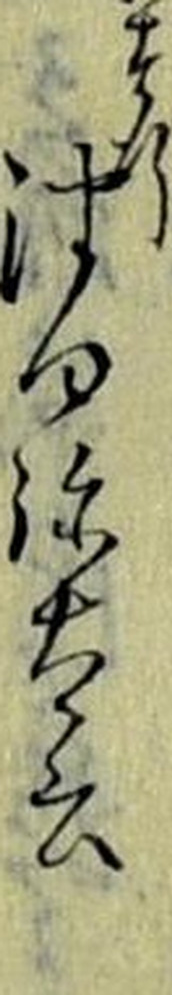津田弥太六
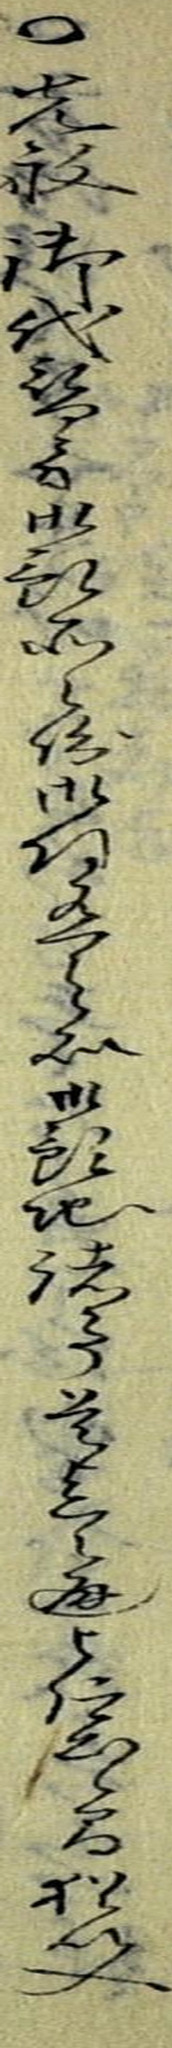〇先般御代替に付御預所之儀御伺有之候処御預地諸事是迄之通被仰出候間猶以入
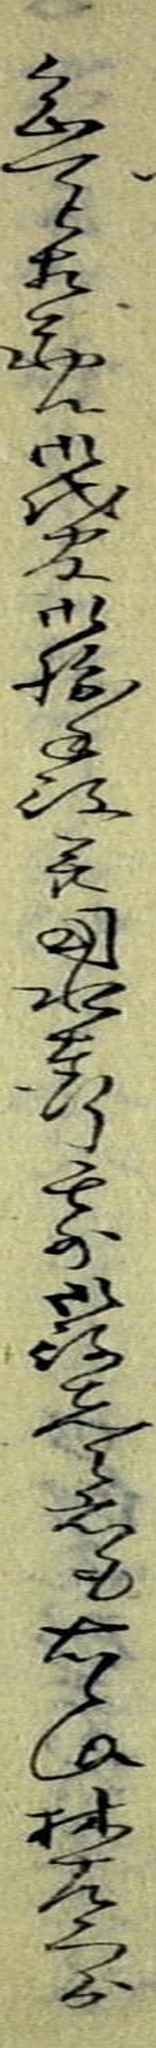念可被相勤候御代官御勝手役并用水奉行其外御役先之者も右之趣林左衛門ゟ
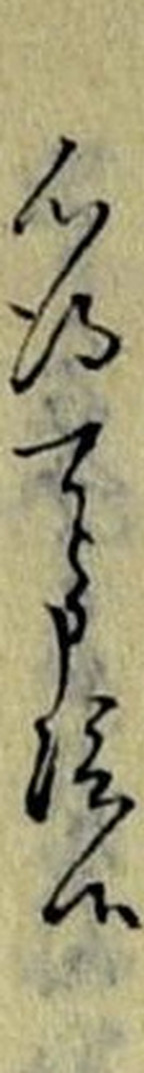心得可被申渡候
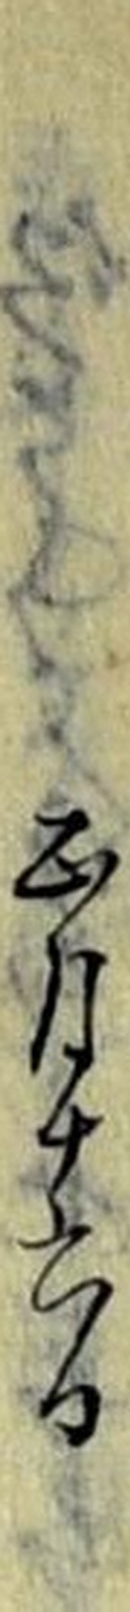正月十六日
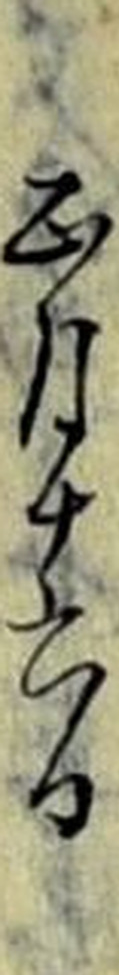正月十六日
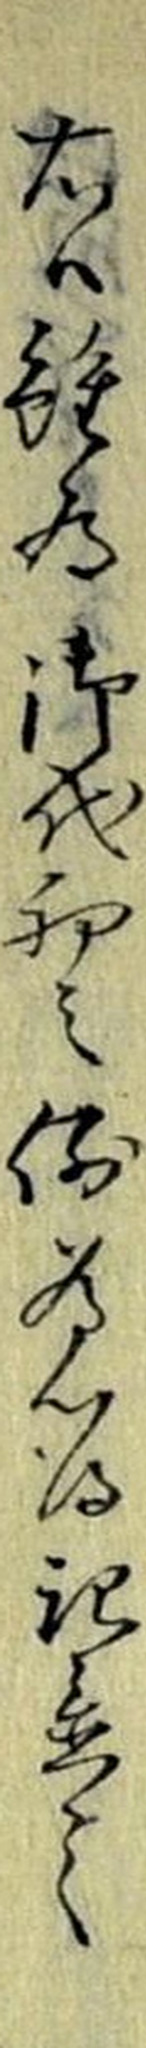右は雖為御代初之例為心得記置之
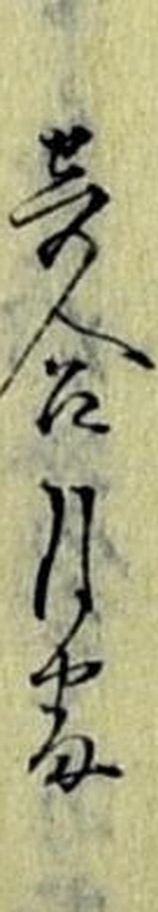寄合月番
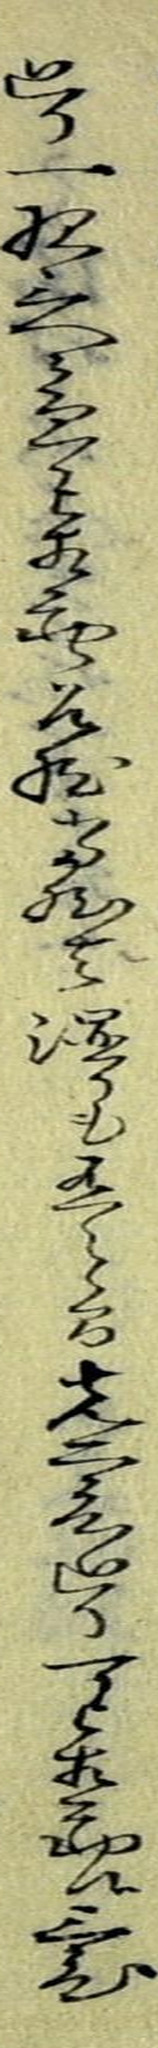廻り一夜三人に而可被相勤候乍然当然は湿りも有之候間先二度廻り可被相勤候三度
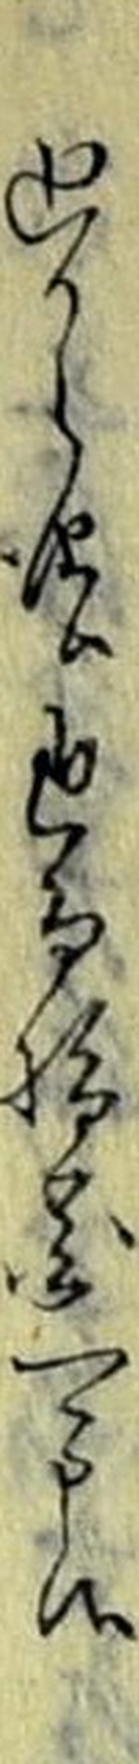廻り之儀は追而指図可申候
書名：命令之部 六
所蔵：福井県文書館 Fukui Prefectural Archives
